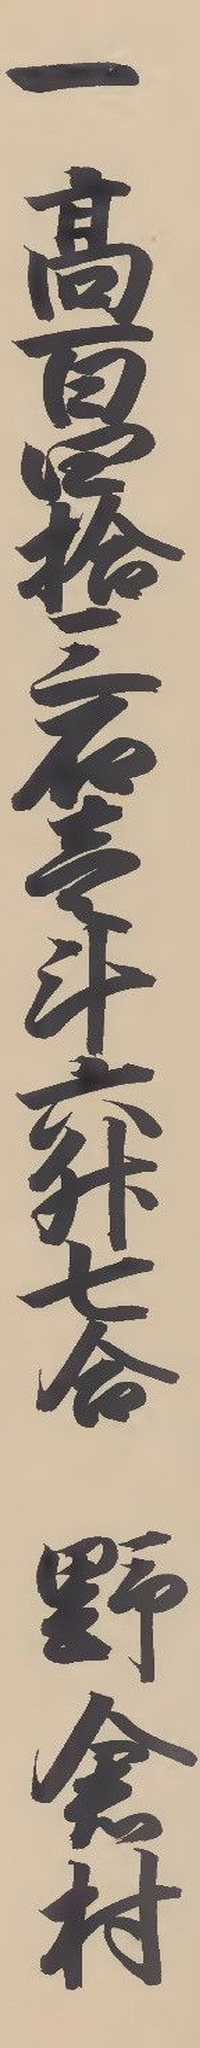一高百四拾三石壱斗六升七合野倉村
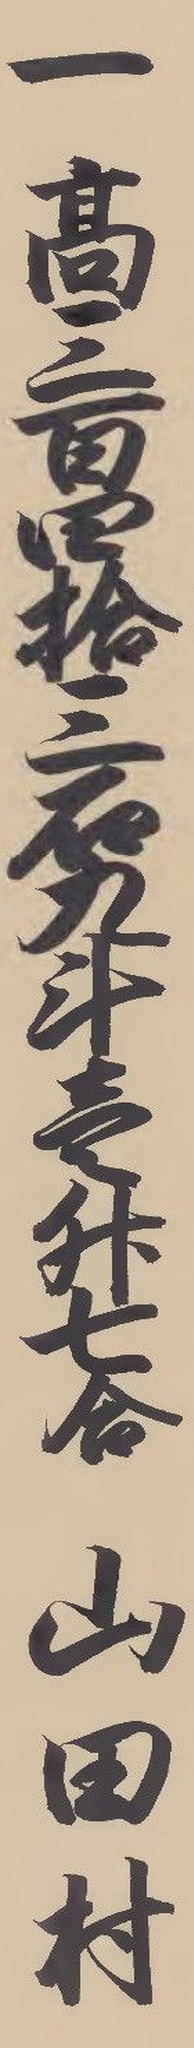一高三百四拾三石九斗壱升七合山田村
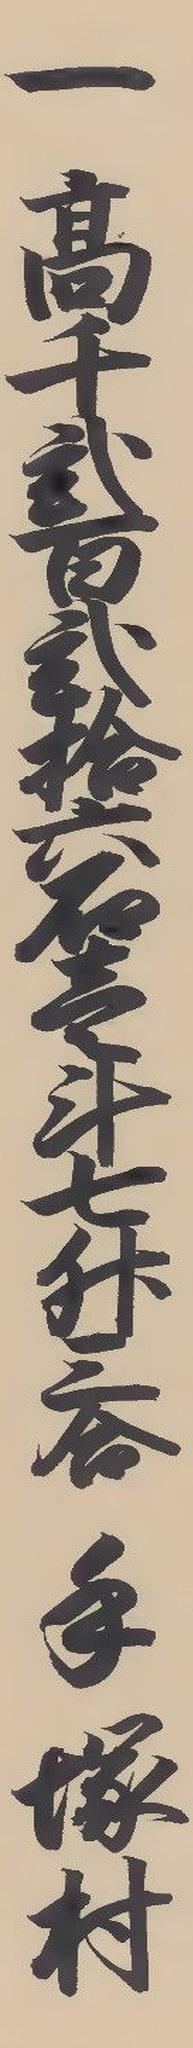一高千弐百弐拾六石壱斗七升三合手塚村
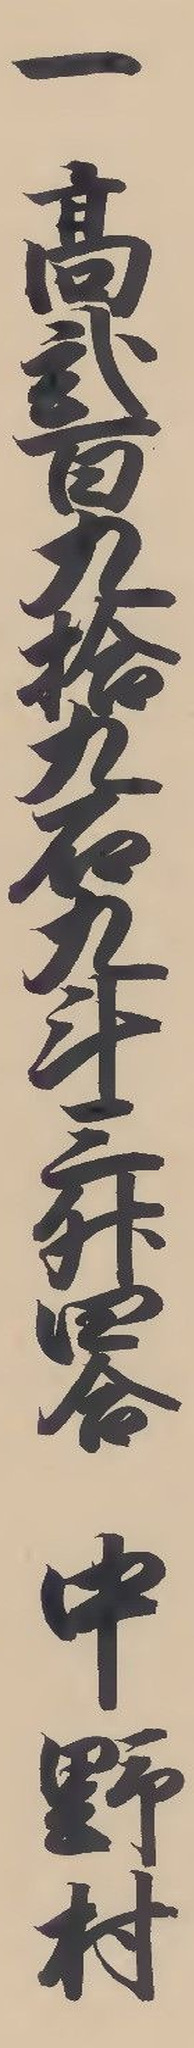一高弐百九拾九石九斗三升四合中野村

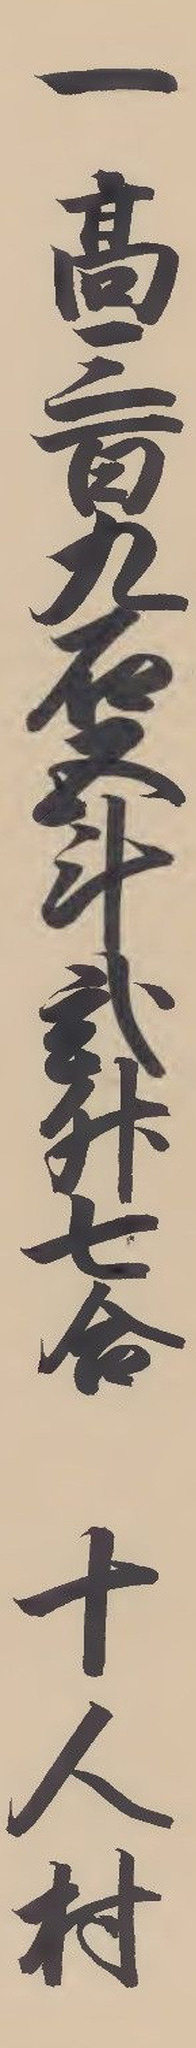一高三百九石五斗弐升七合十人村
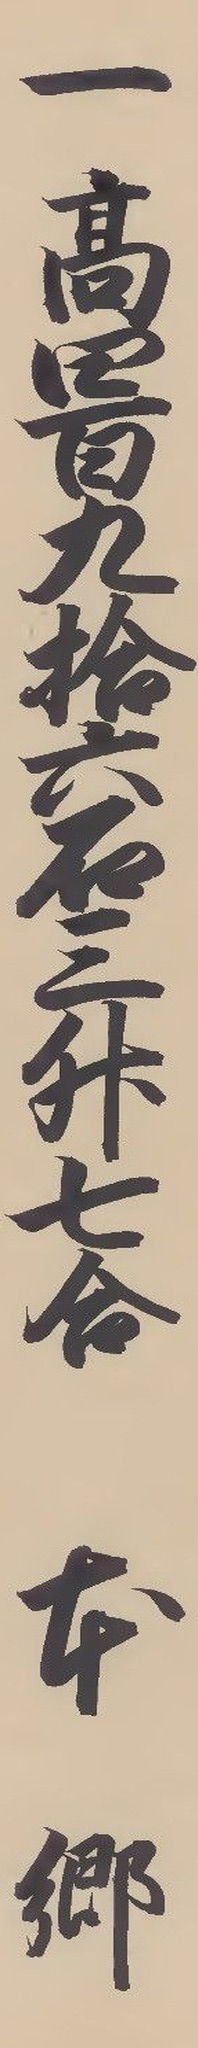一高四百九拾六石三升七合本郷
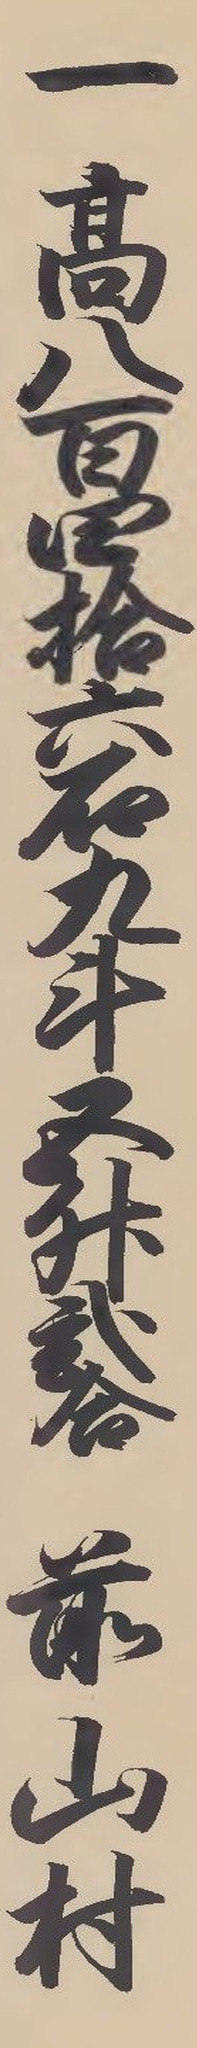一高八百四拾六石九斗五升弐合前山村
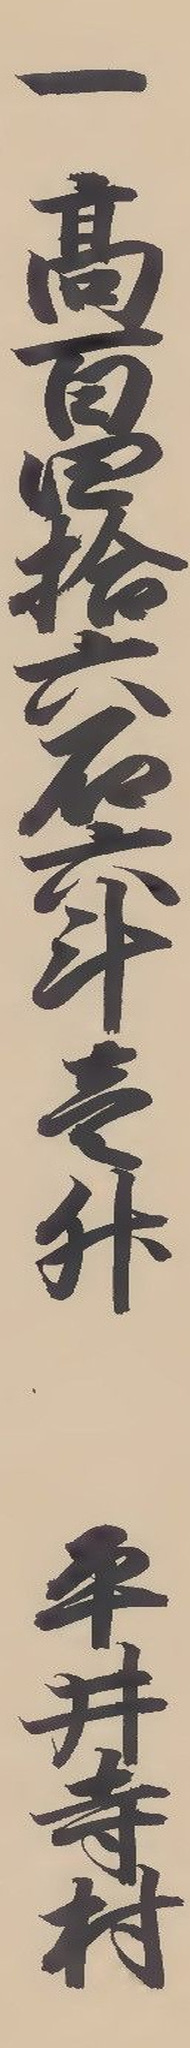一高百四拾六石六斗壱升平井寺村
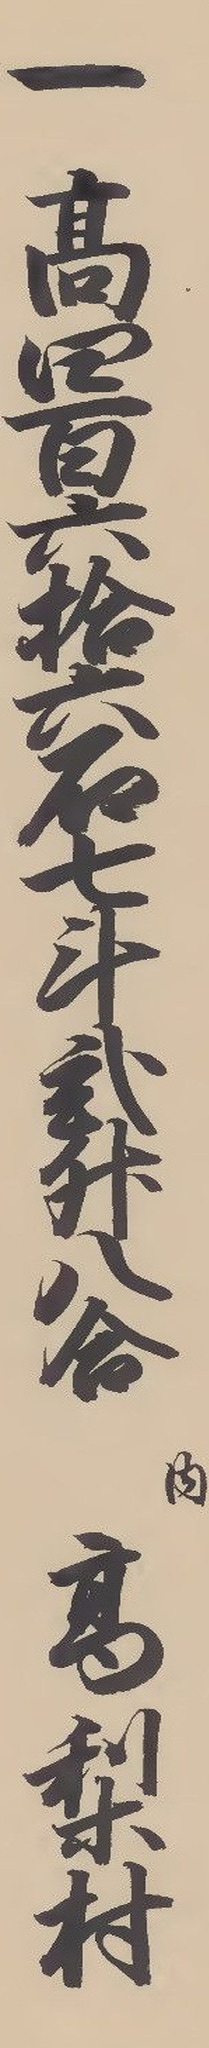一高四百六拾六石七斗弐升八合高梨村
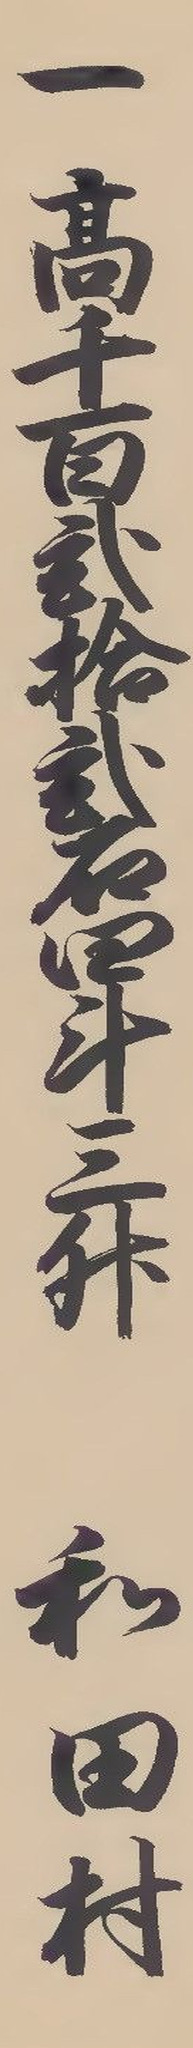一高千百弐拾弐石四斗三升和田村

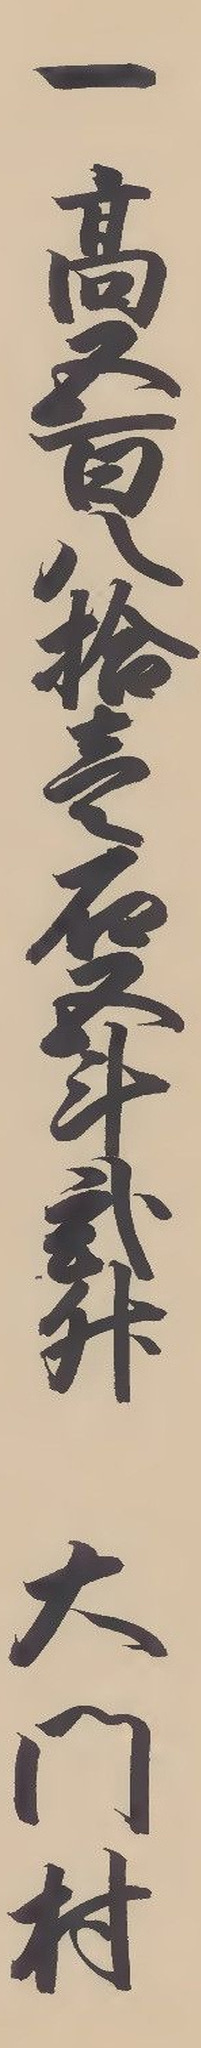一高五百八拾壱石五斗弐升大門村
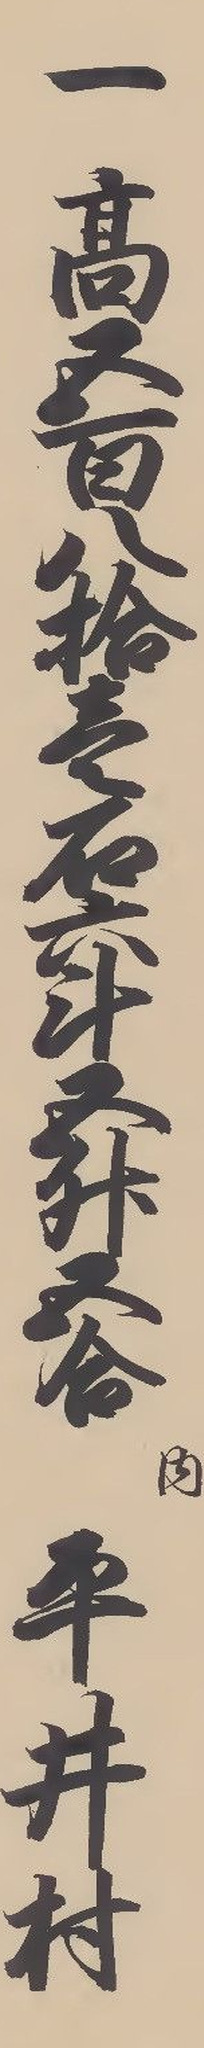一高五百八拾壱石六斗五升五合平井村
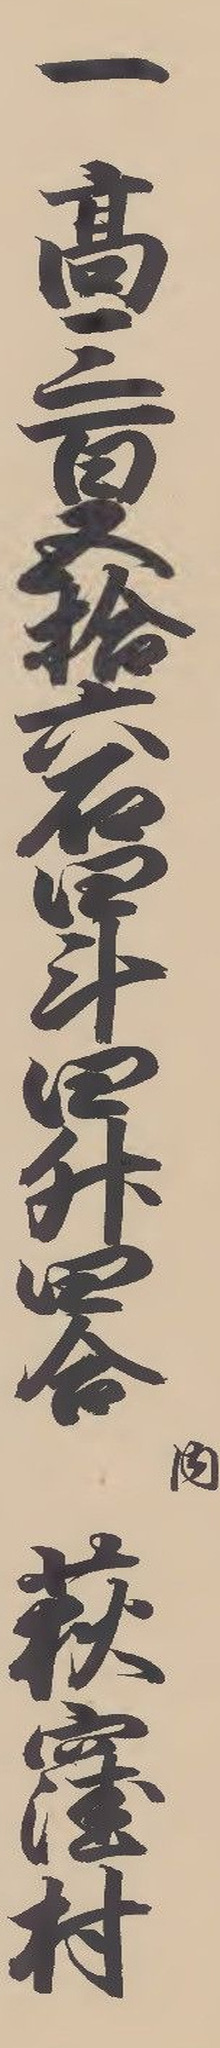一高三百五拾六石四斗四升四合荻窪村
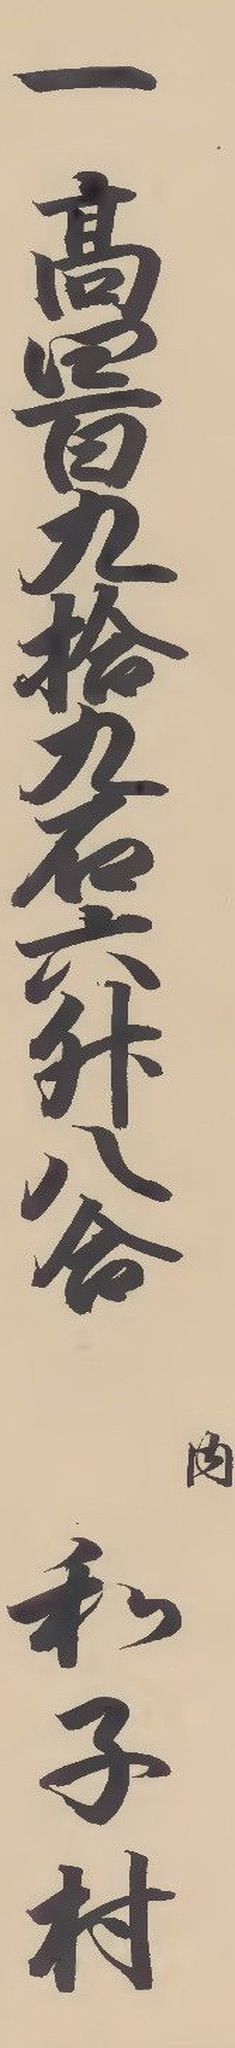一高四百九拾九石六升八合和子村
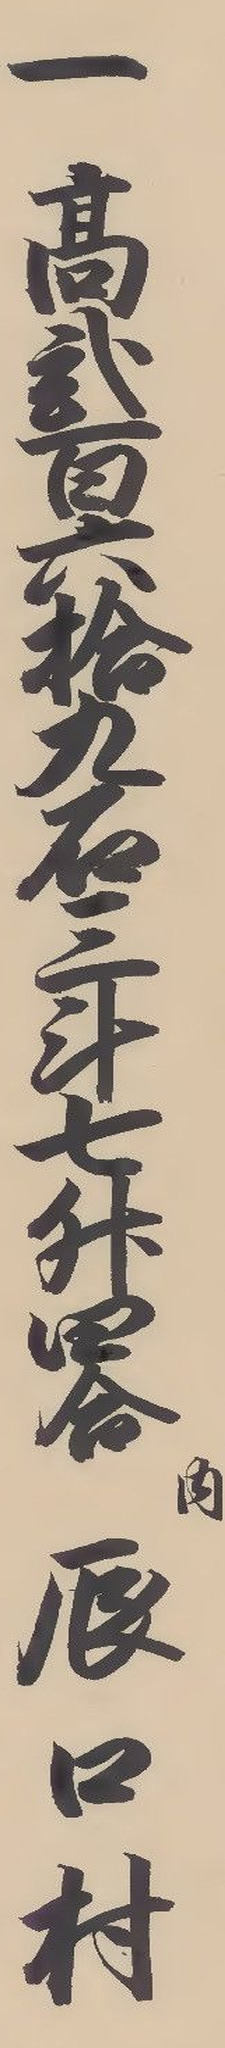一高弐百六拾九石三斗七升四合辰口村
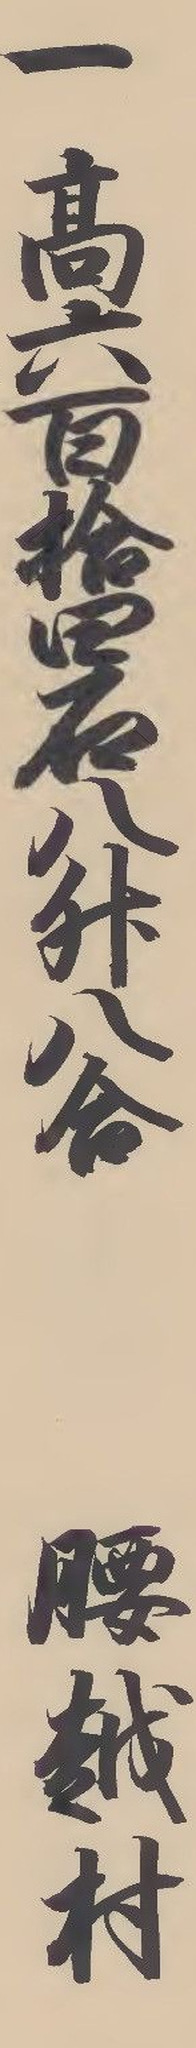一高六百拾四石八升八合腰越村
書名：信濃国郷帳
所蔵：国立公文書館 National Archives of Japan
